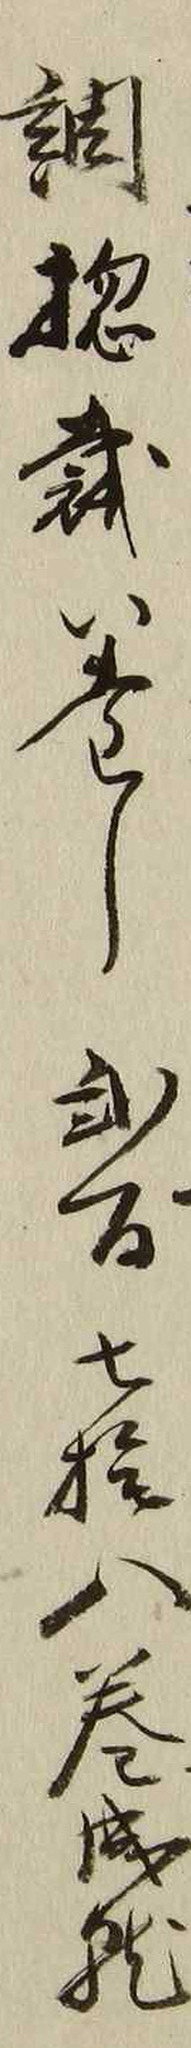調惣載いたし弐百七拾八巻成就
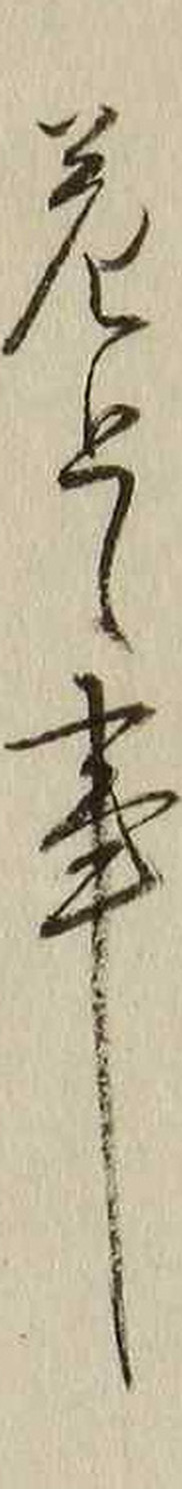差上候事
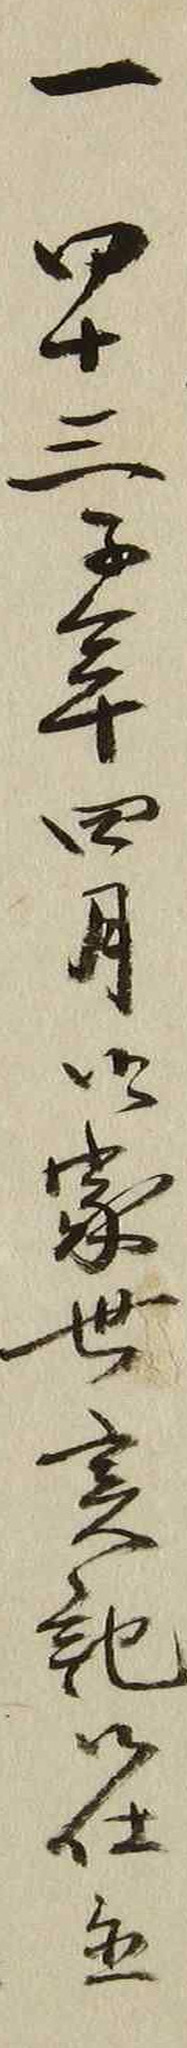一同十三子年四月御家世実記御仕置
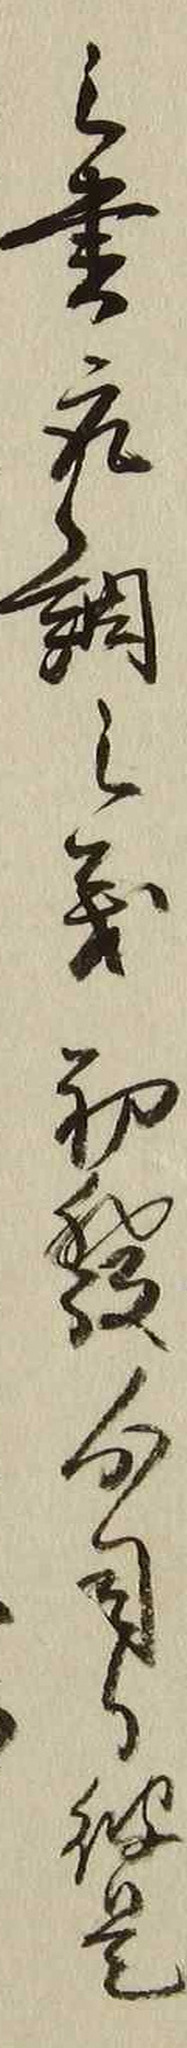之書取調之義初發ゟ司り彼是
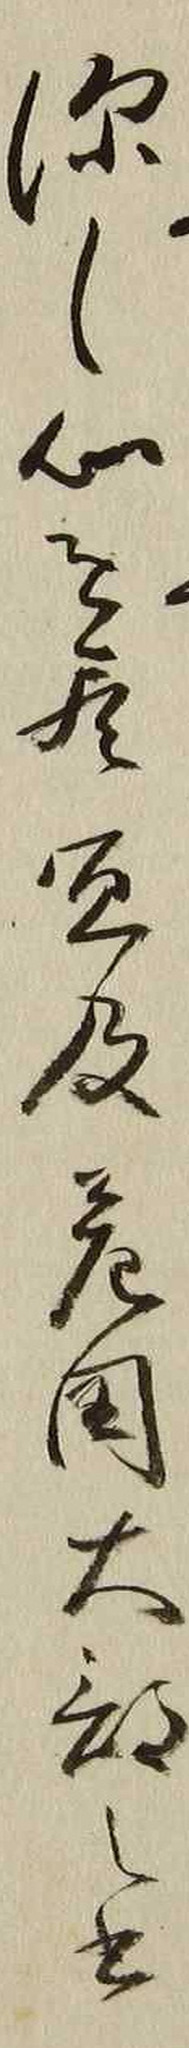深く心を尽宜及指図大部之書
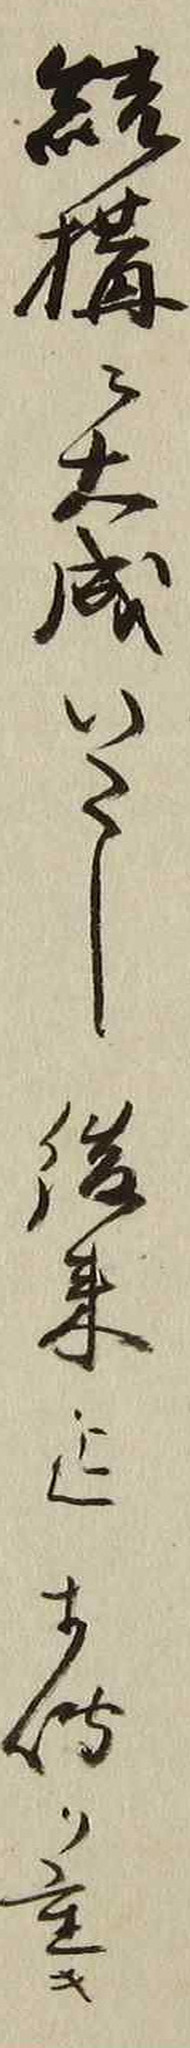結構に大成いたし後來迄相伝り重き
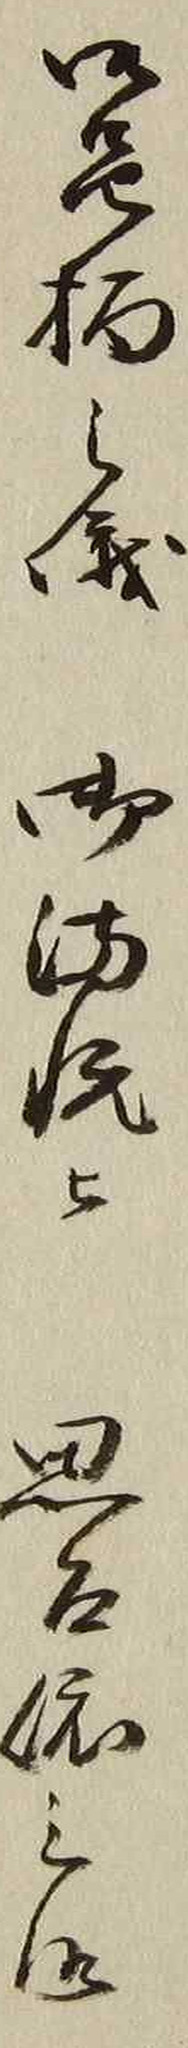御色柄の儀御満悦被思召依之御
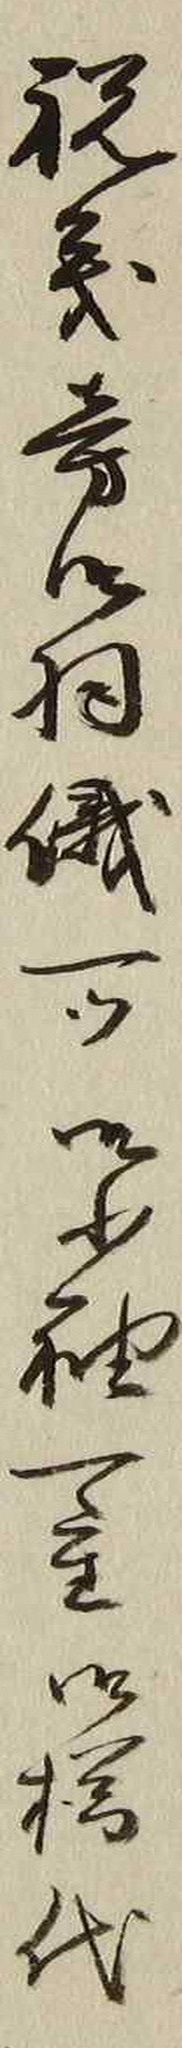祝儀旁御羽織一つ御小袖一具御樽代
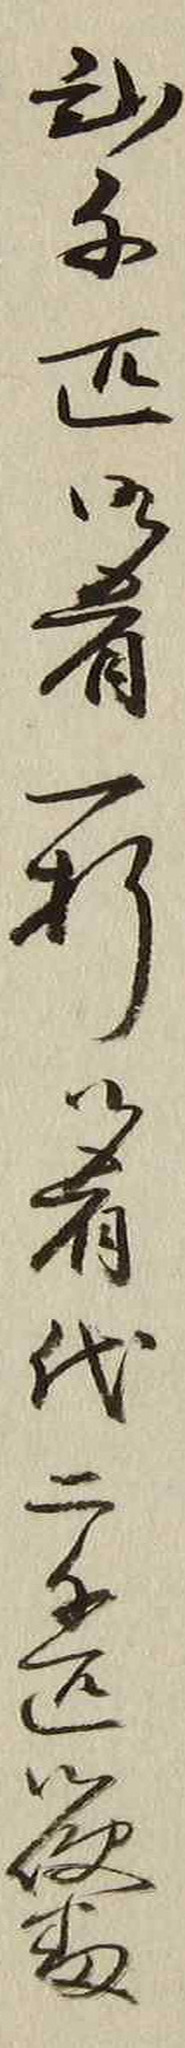弐千匹御肴一折御肴代二千匹御使番
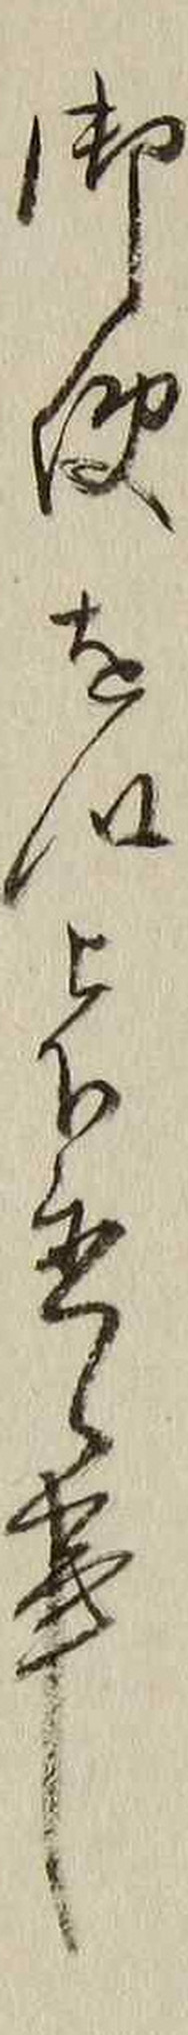御使を以被下置候事
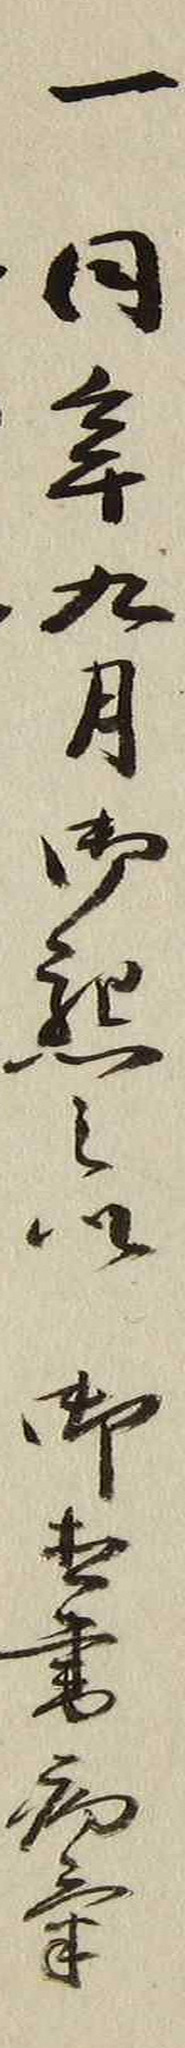一同年九月御懇之以御直書病気
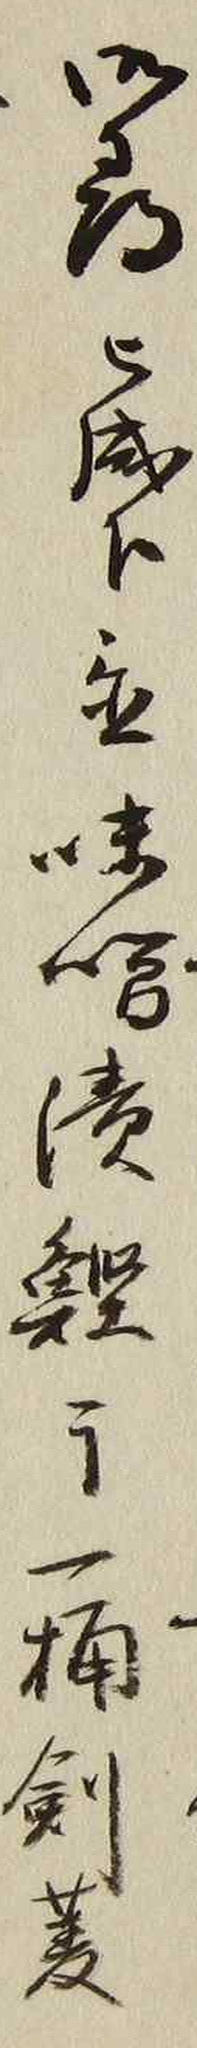御尋被成下置味噌漬鰹干一桶剣菱
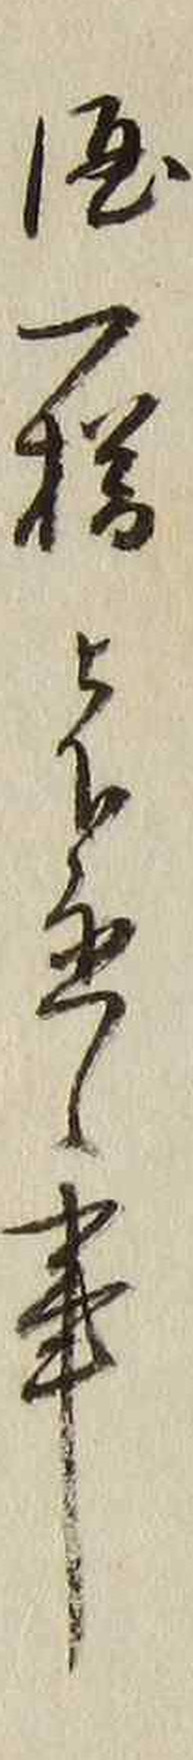酒一樽被下置候事
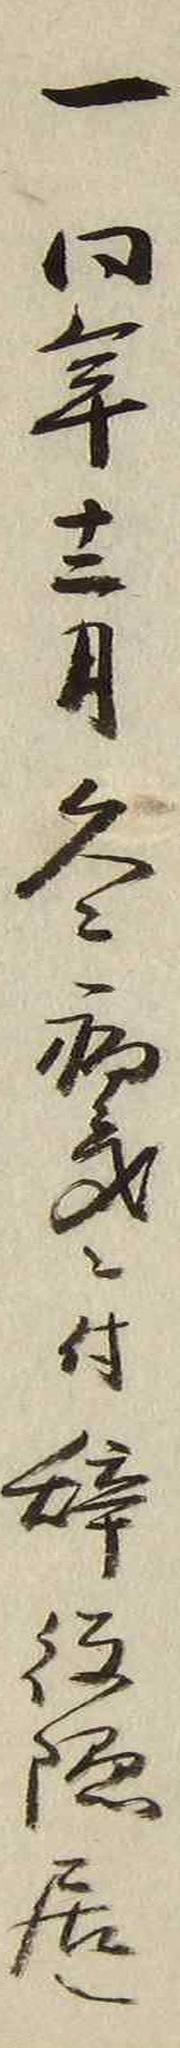一同年十二月久々病身に付辞役隠居
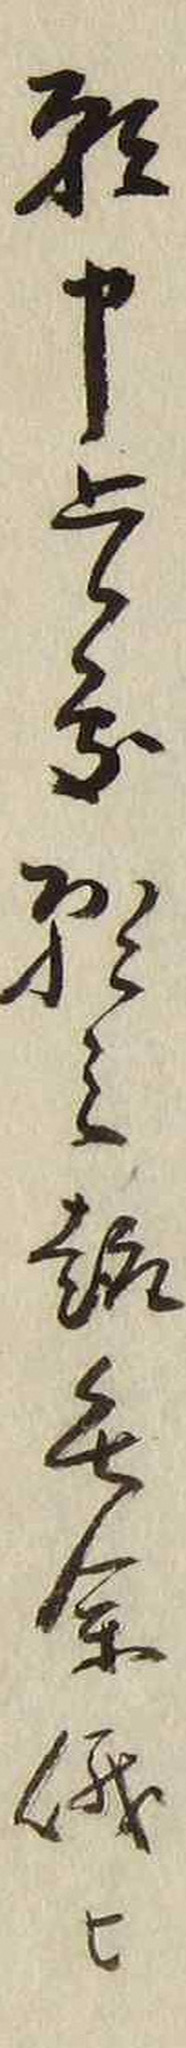願申上候処願之趣無余儀被

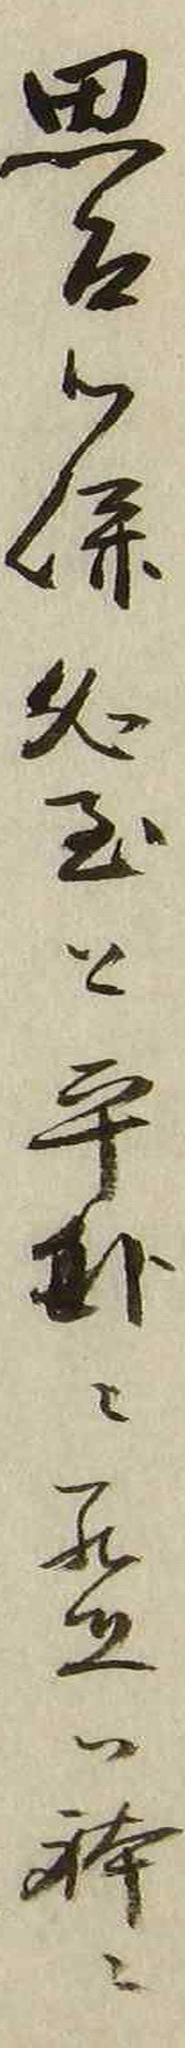思召候併必至と平臥に罷在候体に
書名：諸士系譜　巻之292　き之部1
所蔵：会津若松市立会津図書館
